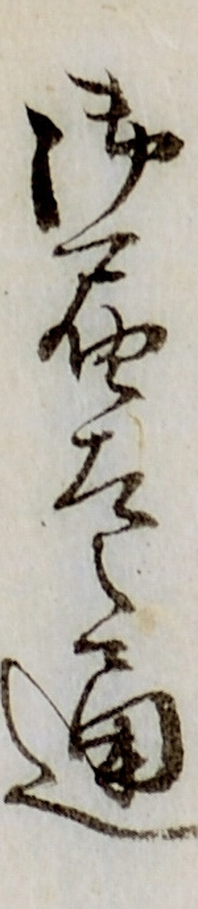御届左之通
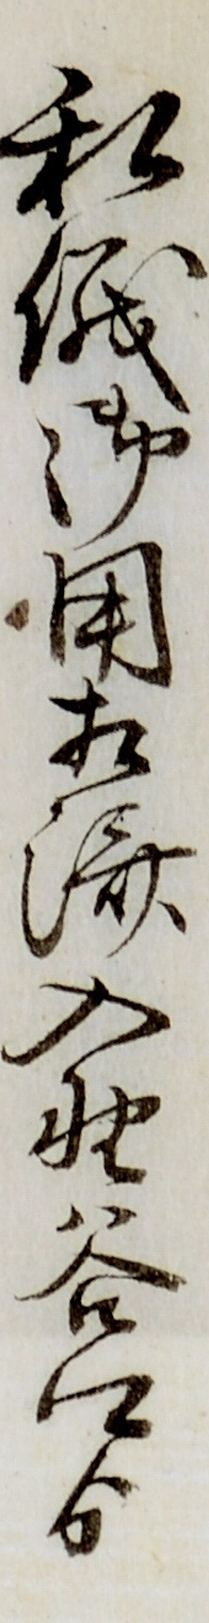私儀御用相済入野谷郷ゟ
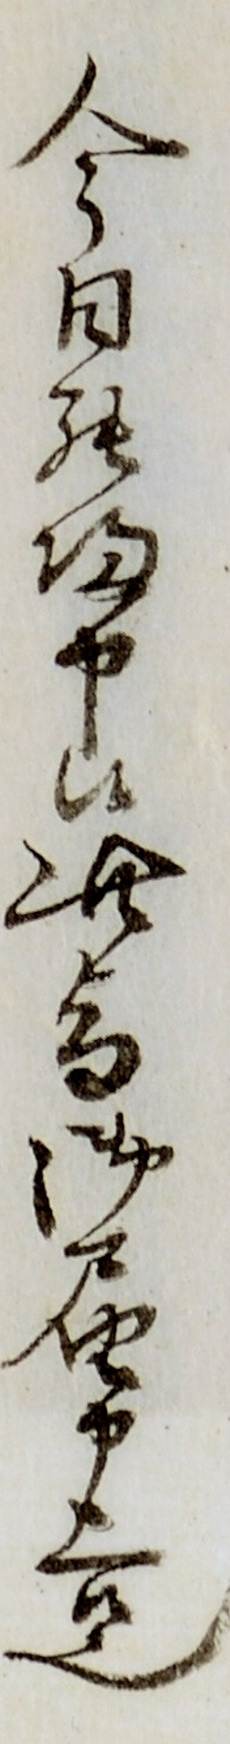今日罷帰申候此旨御届申上候也
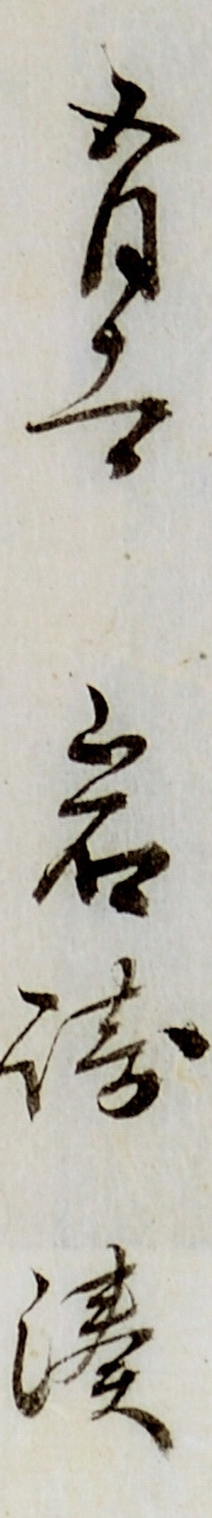五月十一日岩崎湊
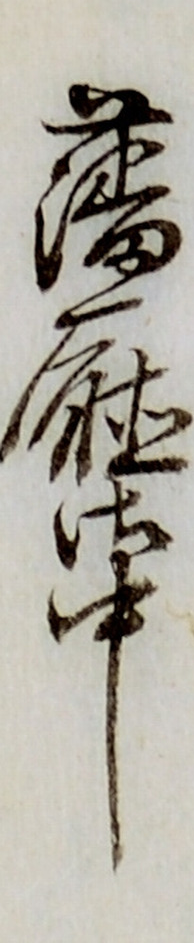藩庁御中
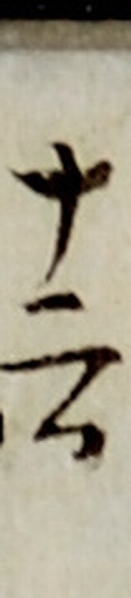十二日
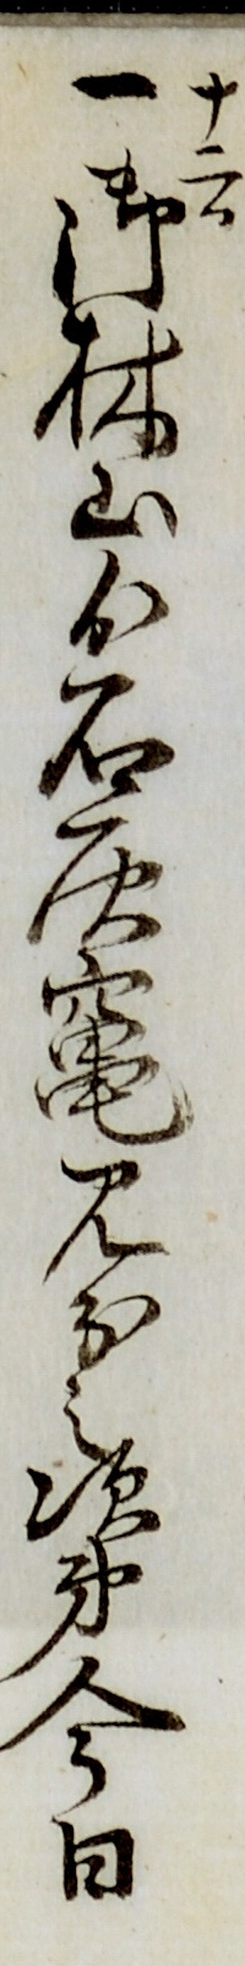一御林山ゟ石灰竃見分之次第今日
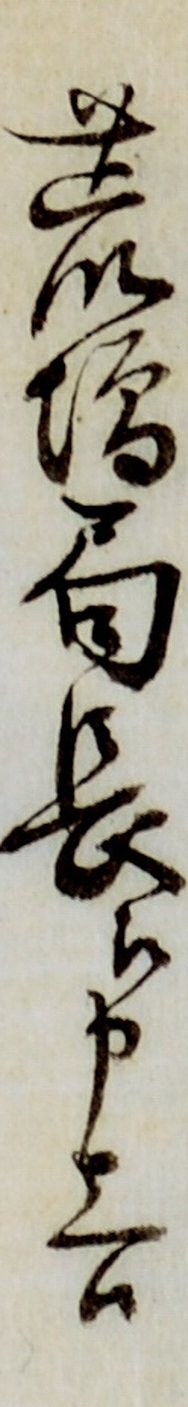荒増局長え申上候
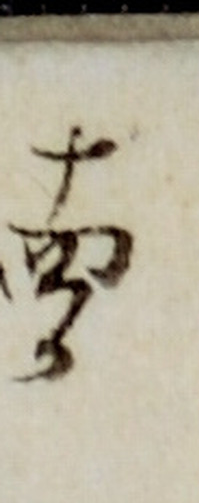十四日
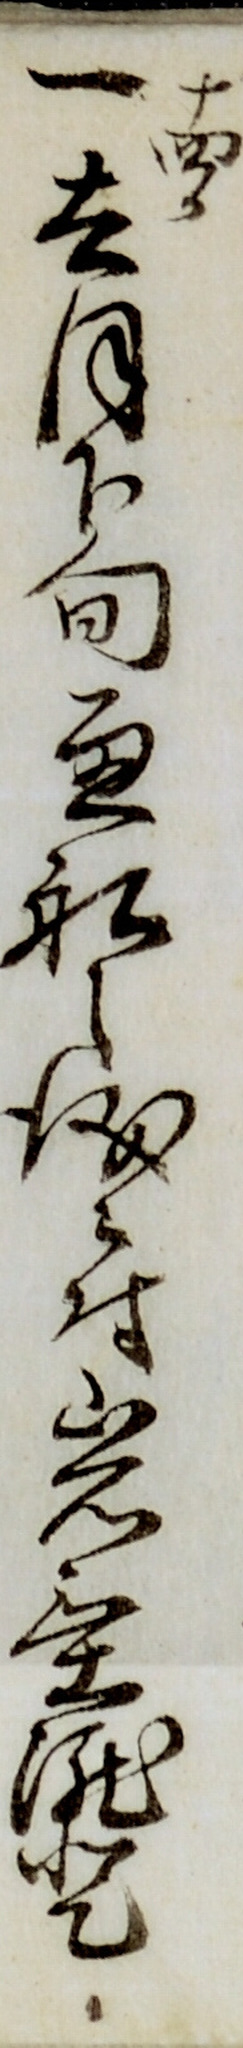一去月下旬通船之儀に付岩垂滝登
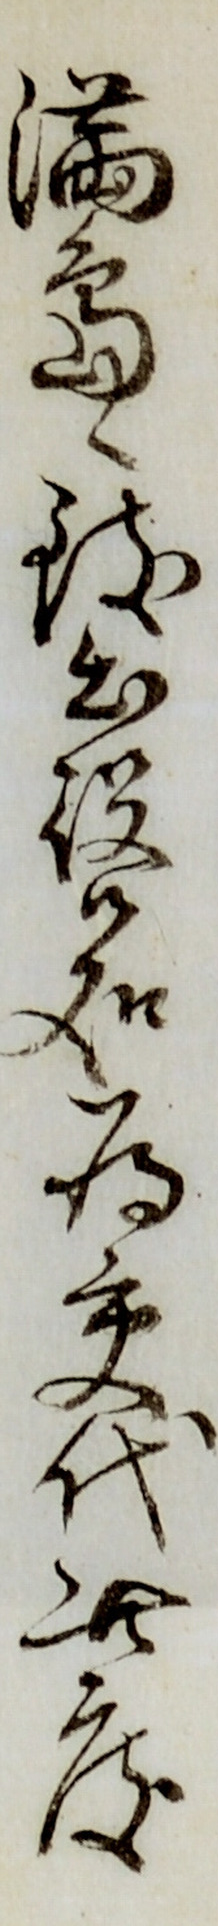満島へ致出役候処為交代此度
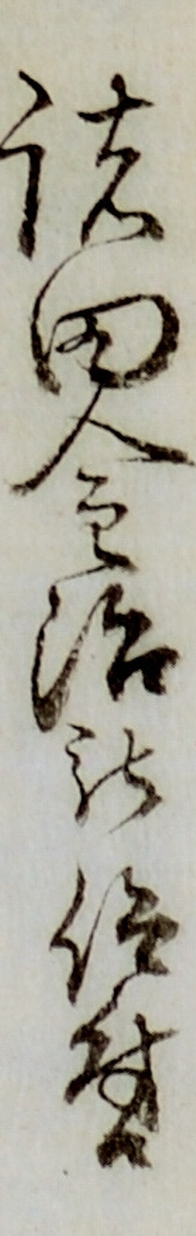諸田金治被仰付候
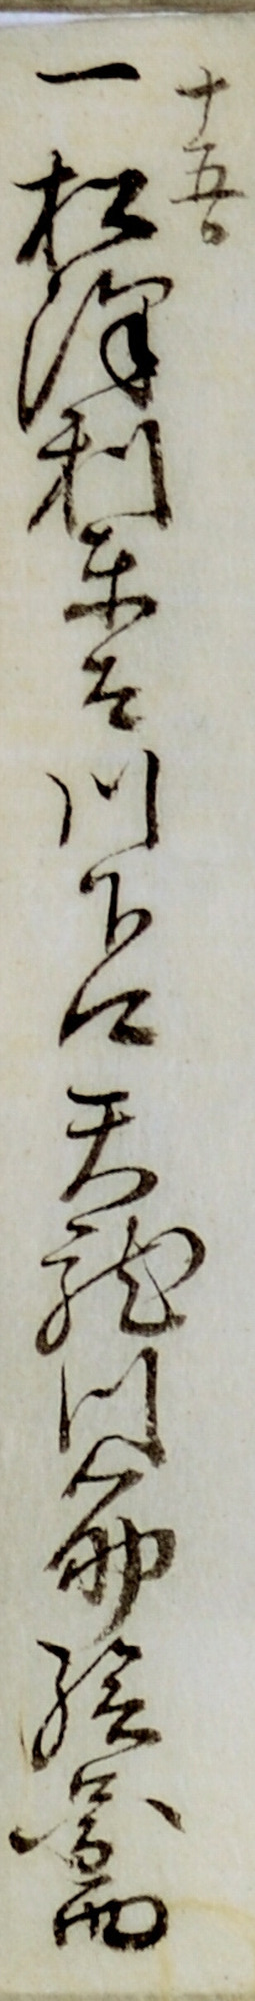一松沢利東太川下郷天龍川筋絵図面

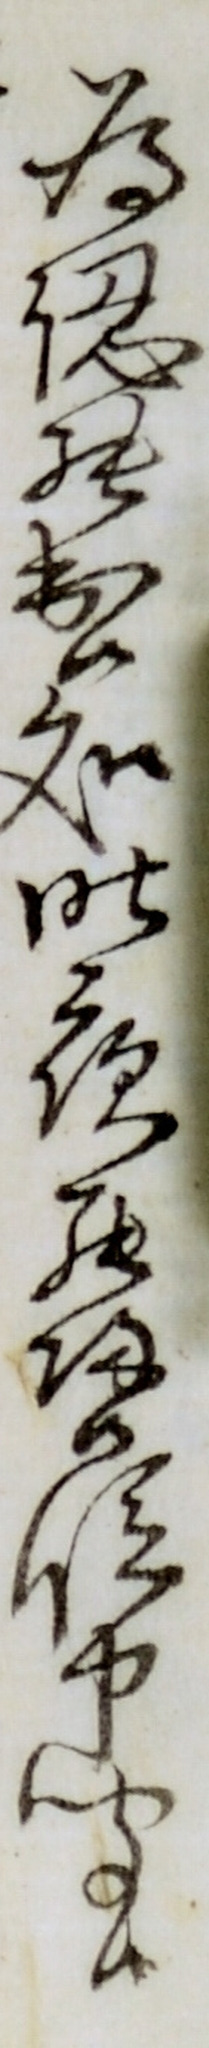為認罷在候処昨夜罷帰候段申聞候
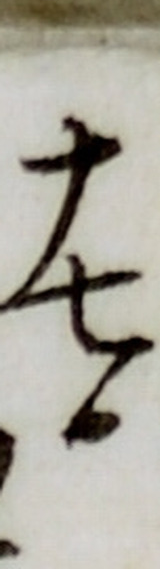十七日
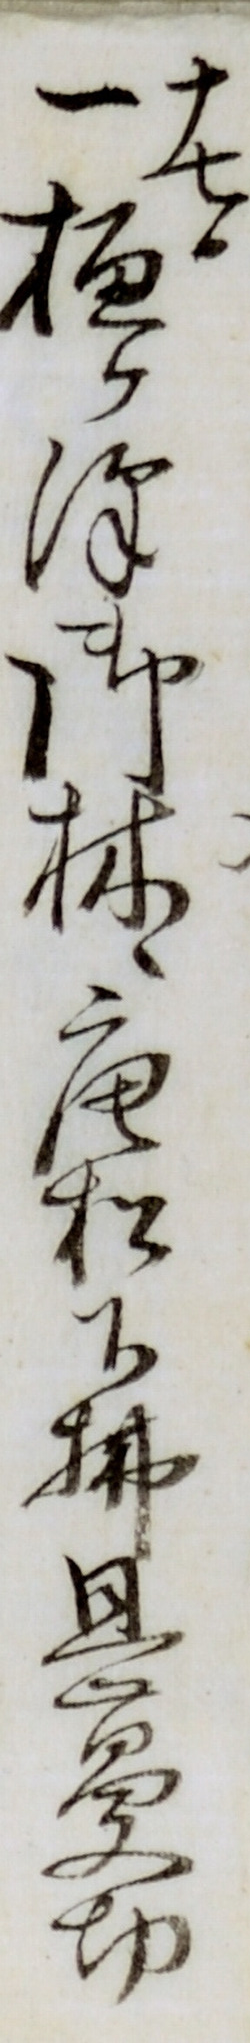一樋ヶ沢御林へ唐松下払且蔓切
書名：山林方諸事御用留
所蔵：伊那市立高遠町図書館・合同会社AMANE
